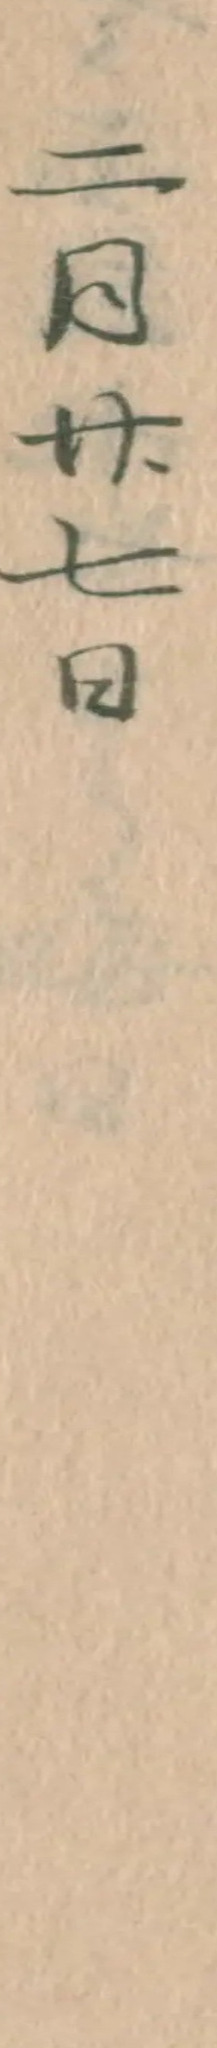二月廿七日
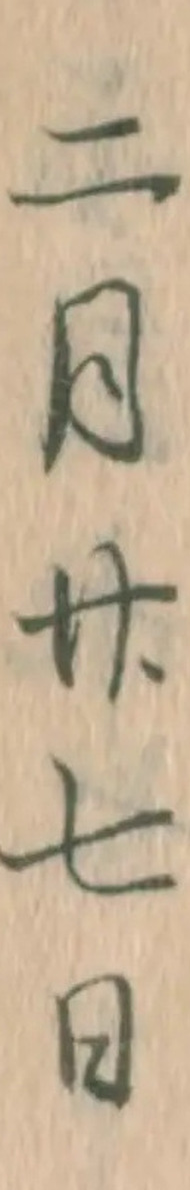二月廿七日
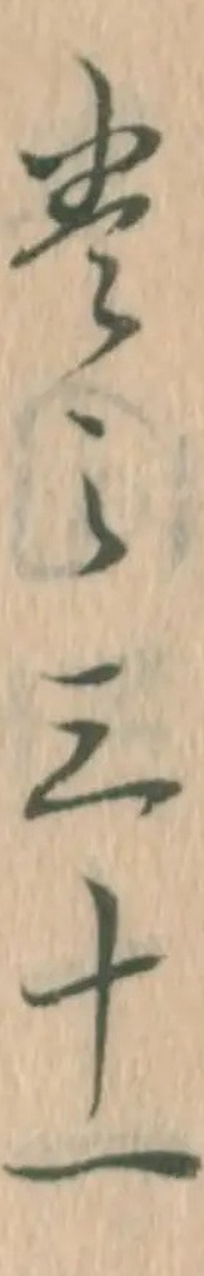巻之三十一
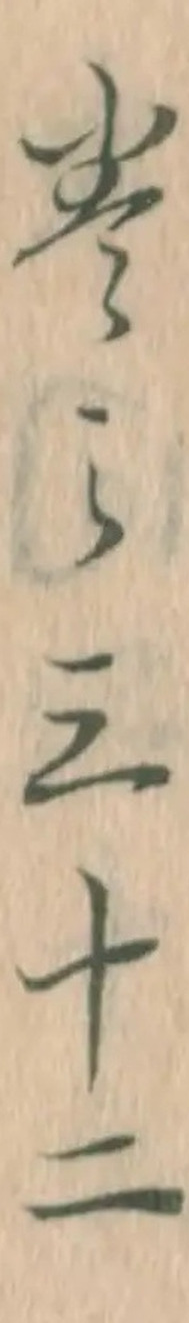巻之三十二
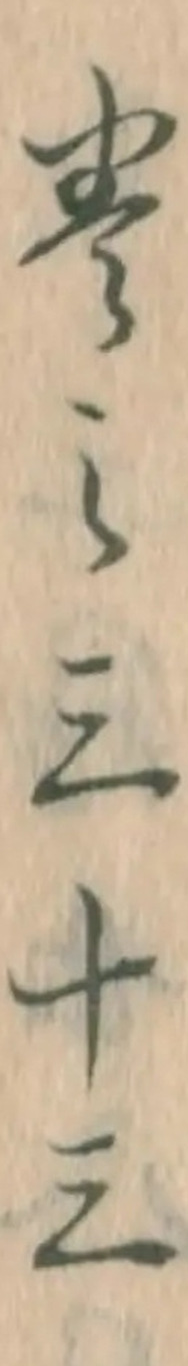巻之三十三

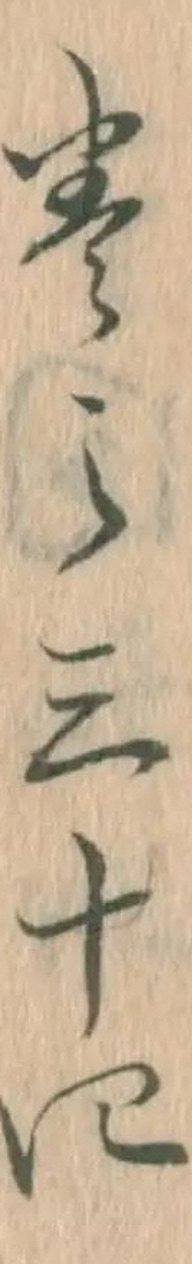巻之三十四
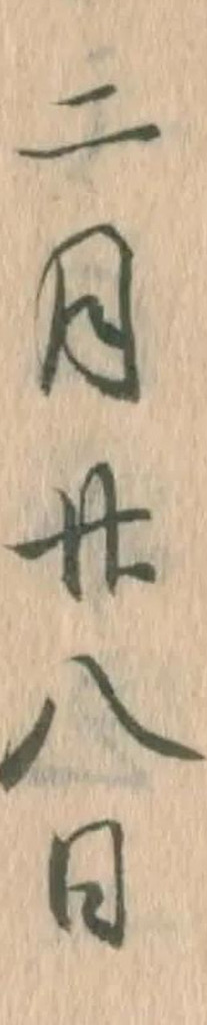二月廿八日
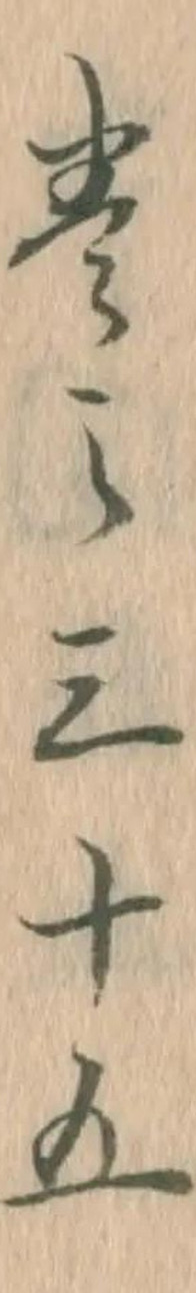巻之三十五
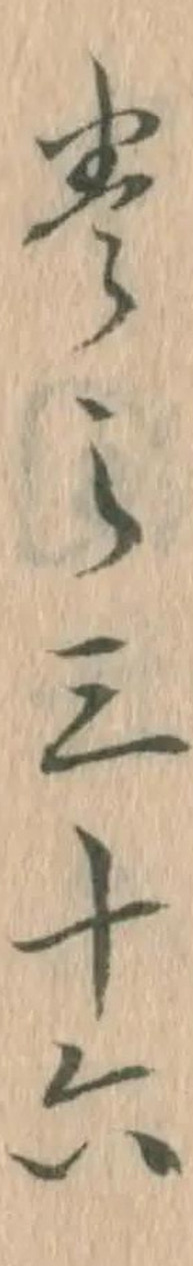巻之三十六
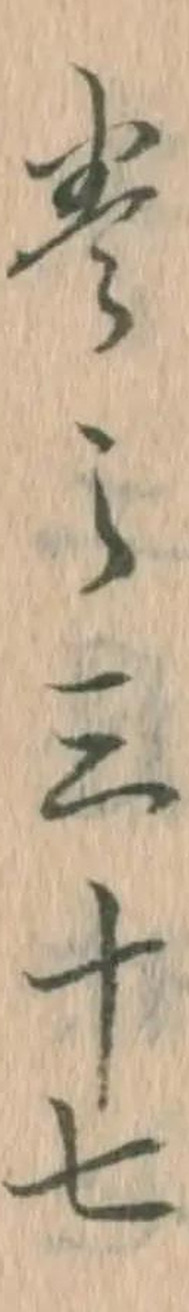巻之三十七
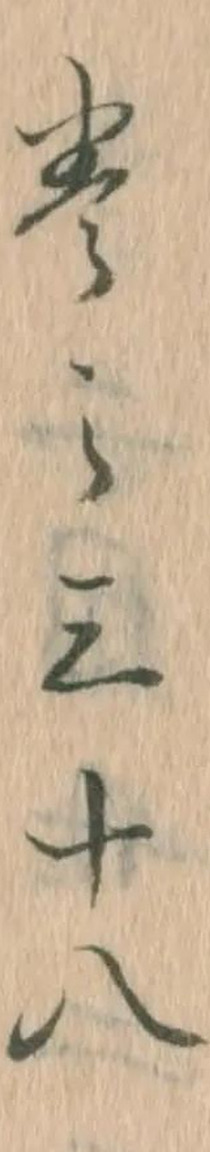巻之三十八
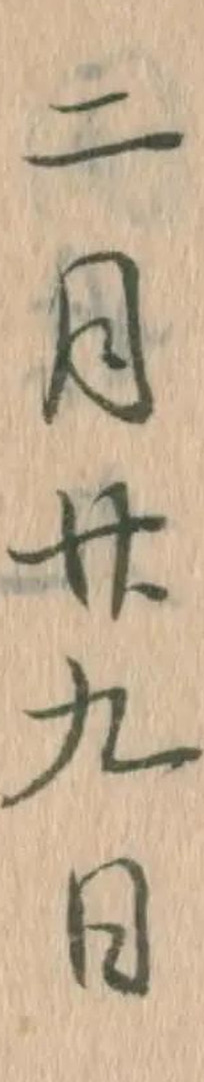二月廿九日
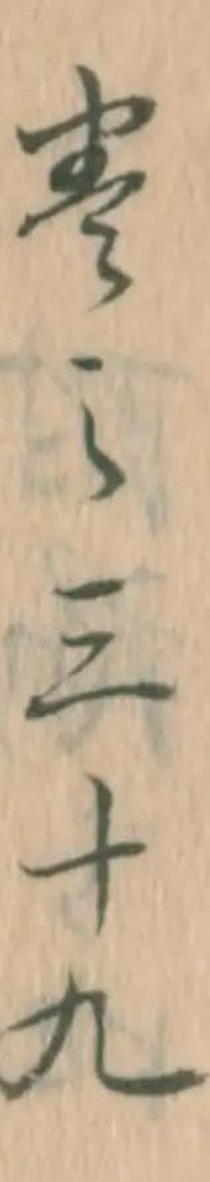巻之三十九
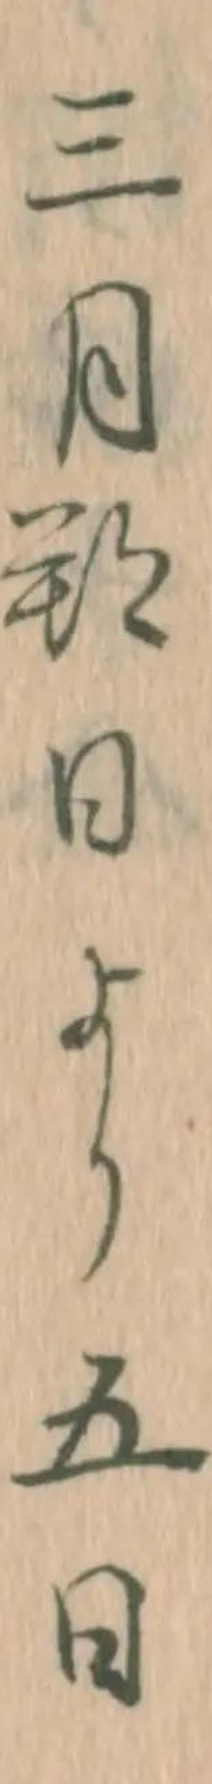三月朔日より五日
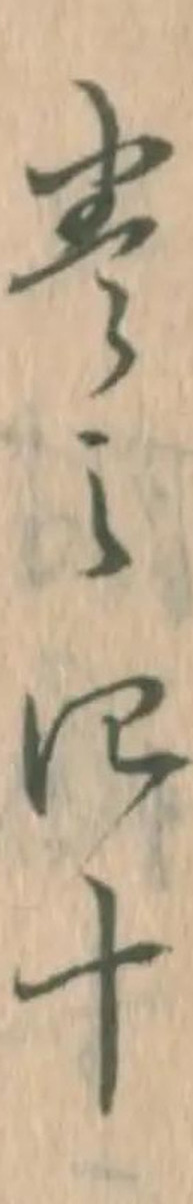巻之四十
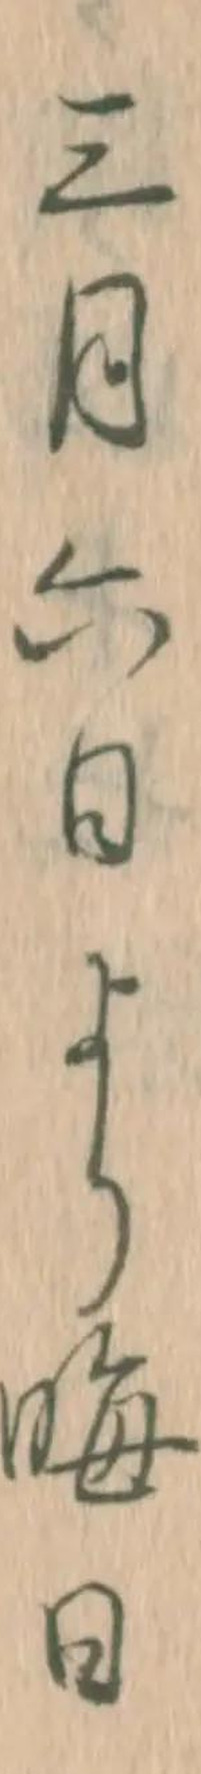三月六日より晦日
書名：切支丹御退治記 49巻. [1]
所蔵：国立国会図書館 National Diet Library, JAPAN
